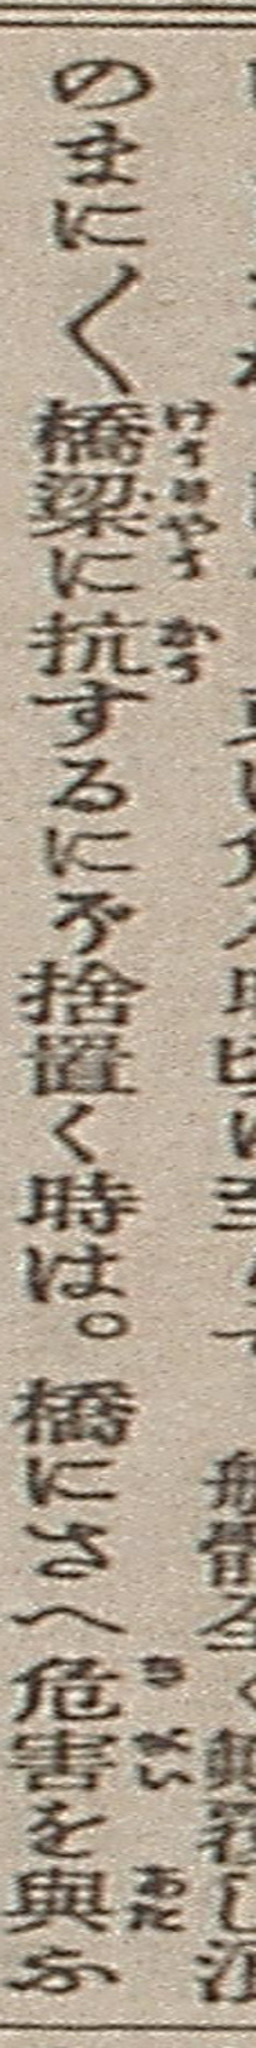のまに〳〵橋梁に抗するにぞ捨置く時は。橋にさへ危害を与ふ
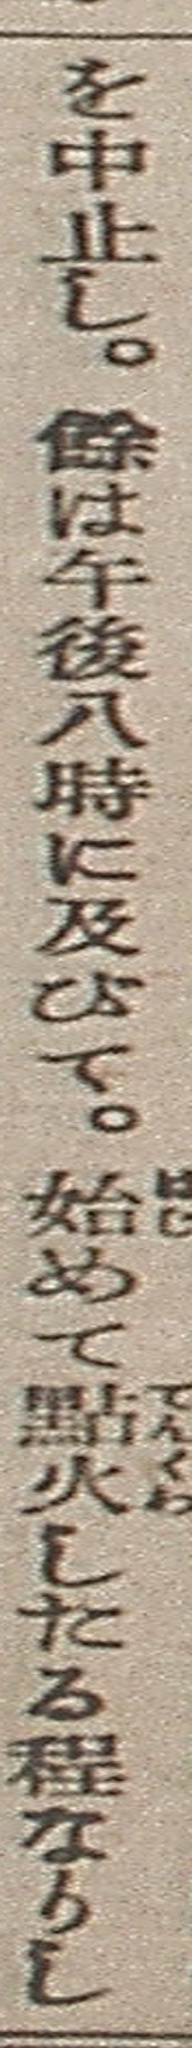を中止し。余は午後八時に及びて。始めて点火したる程なりし
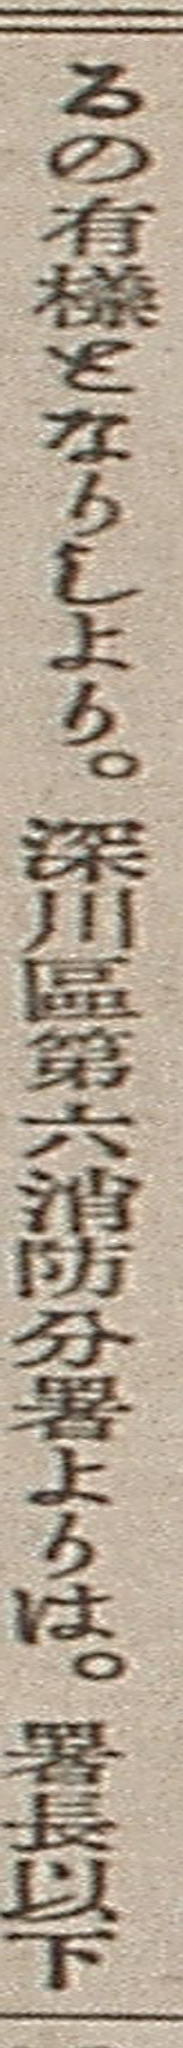るの有様となりしより。深川区第六消防分署よりは。署長以下
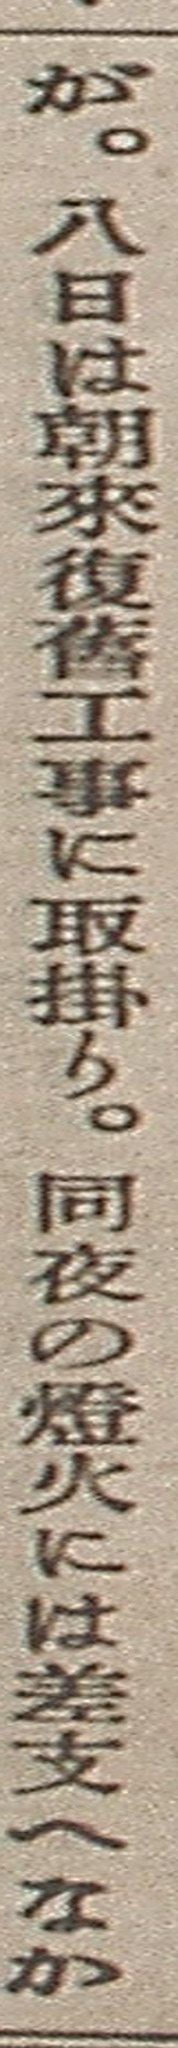が。八日は朝来復旧工事に取掛り。同夜の燈火には差支へなか
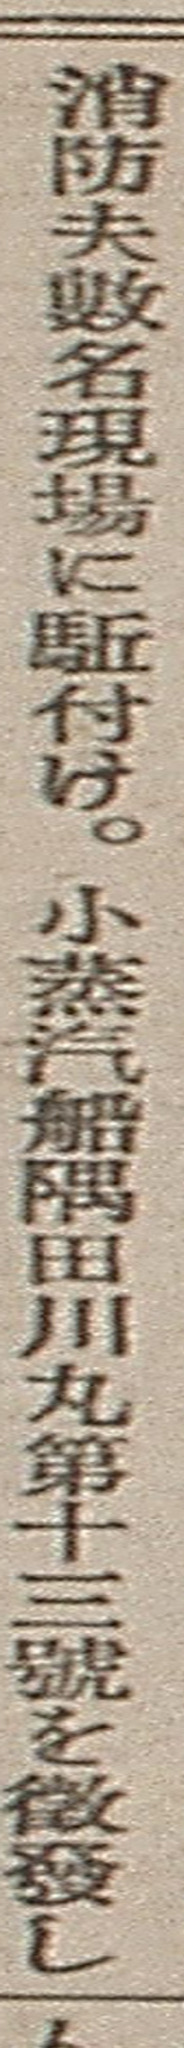消防夫数名現場に駈付け。小蒸汽船隅田川丸第十三号を徴発し
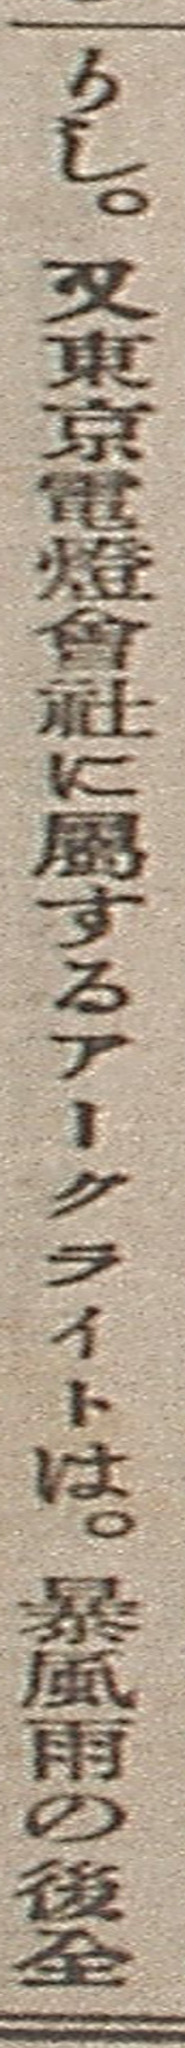りし。又東京電燈会社に属するアークライトは。暴風雨の後全

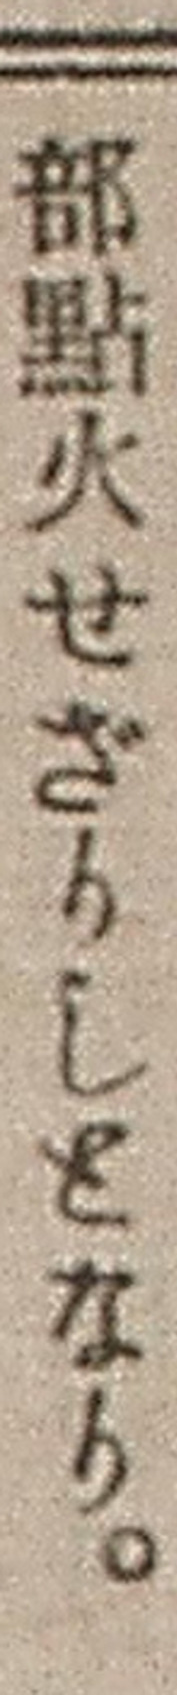部点火せざりしとなり。
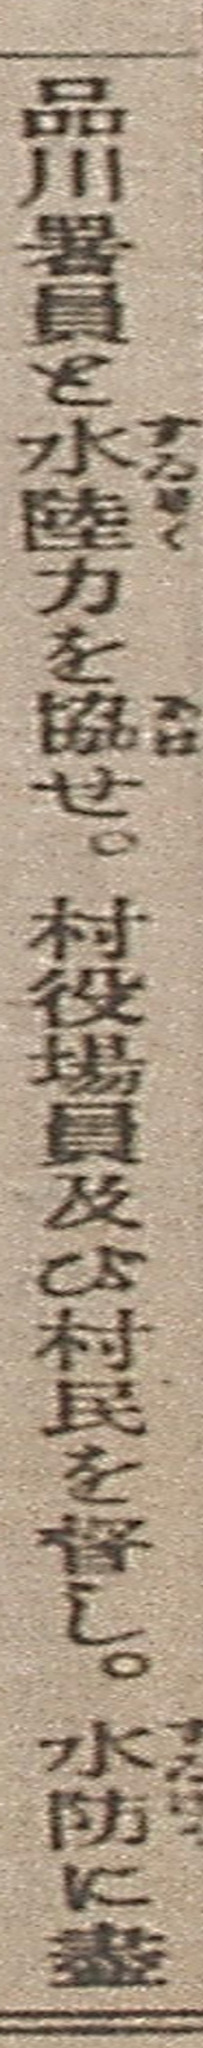品川署員と水陸力を協せ。村役場員及び村民を督し。水防に尽
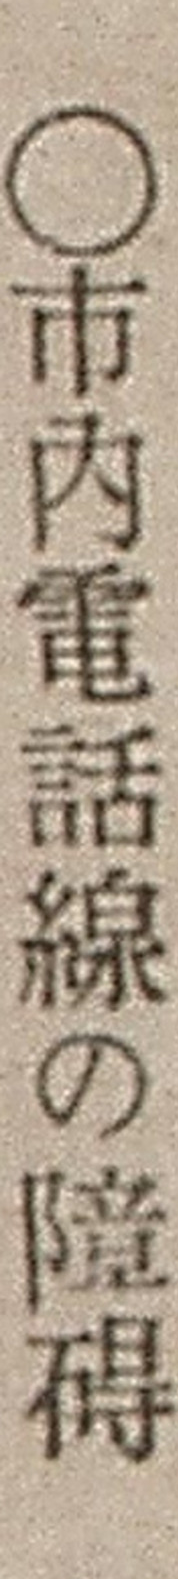〇市内電話線の障碍
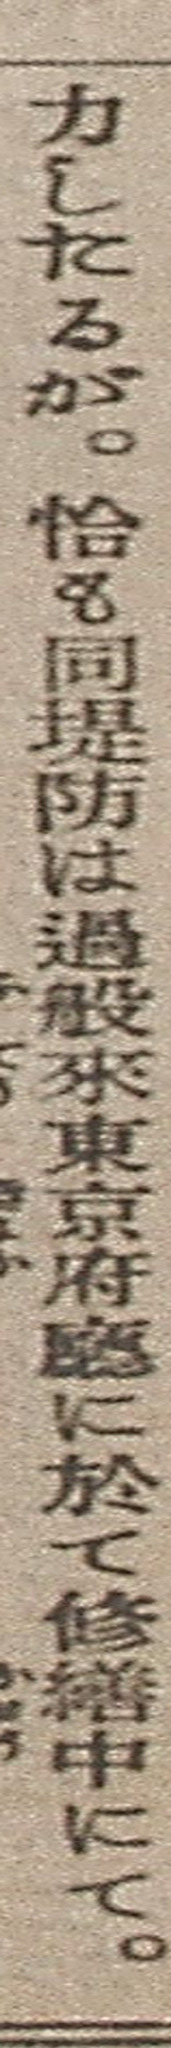力したるが。恰も同堤防は過般来東京府庁に於て修繕中にて。
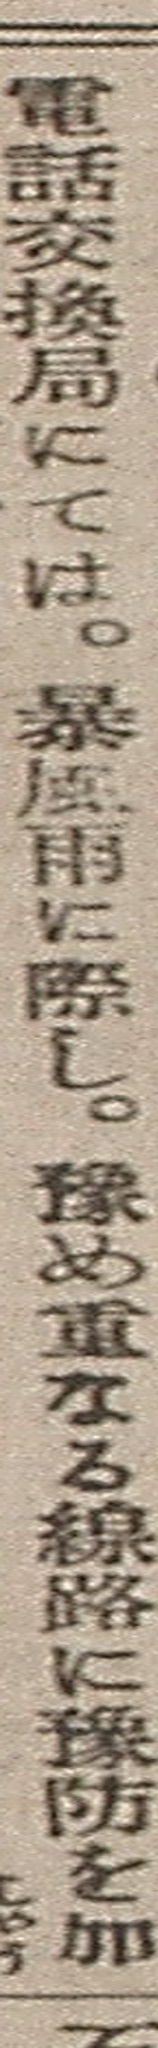電話交換局にては。暴風雨に際し。豫め重なる線路に予防を加
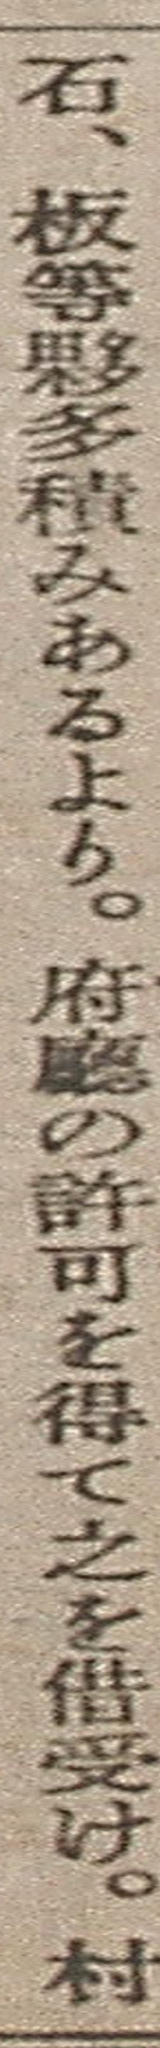石、板等夥多積みあるより。府庁の許可を得て之を借受け。村
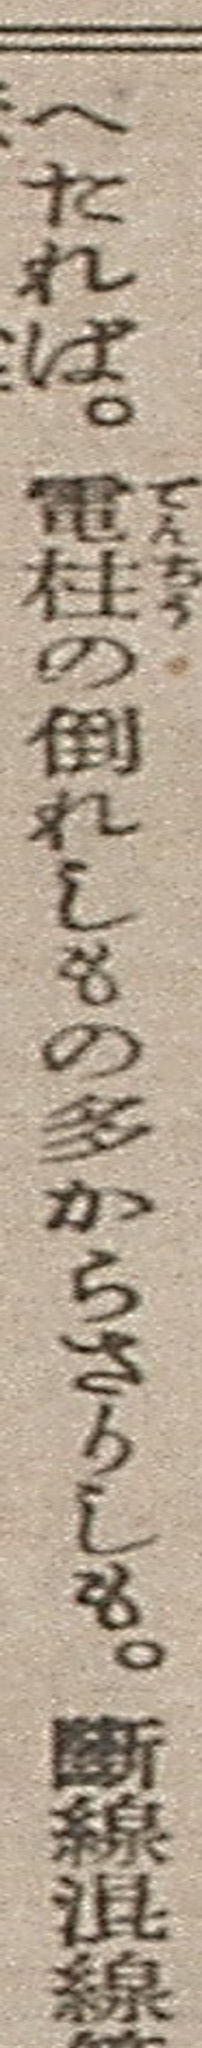へたれば。電柱の倒れしもの多からさりしも。断線混線等の障
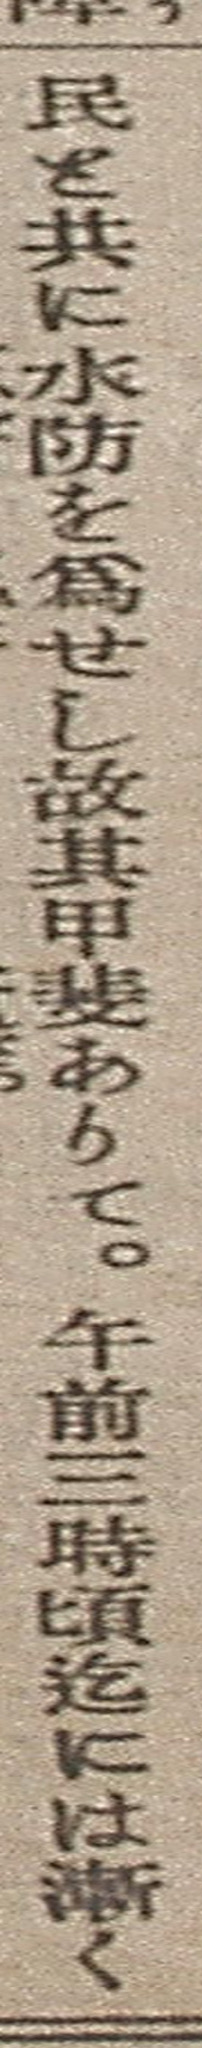民と共に水防を為せし故其甲斐ありて。午前三時頃迄には漸く
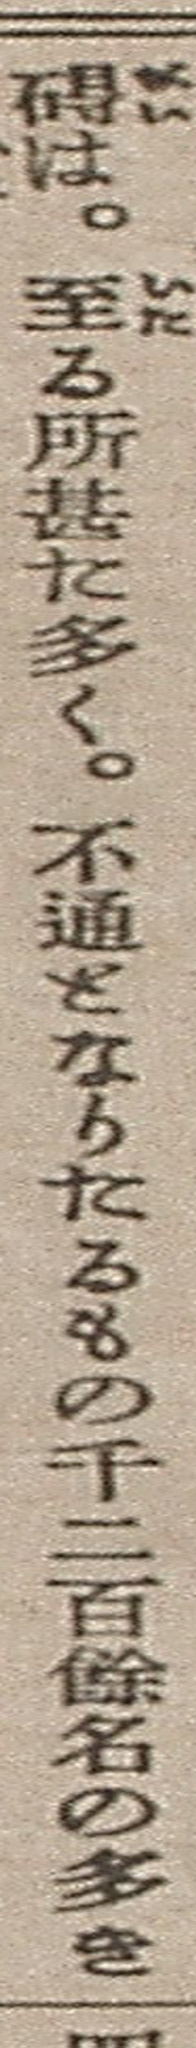碍は。至る所甚た多く。不通となりたるもの千二百余名の多き
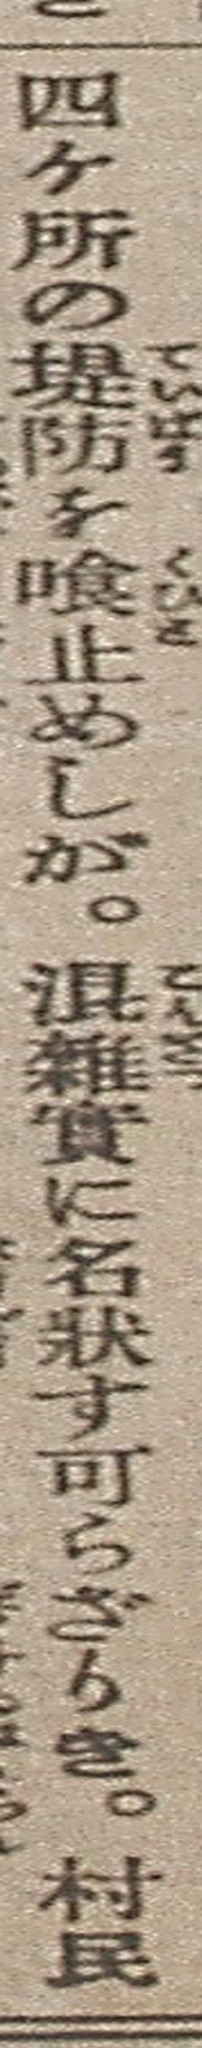四ケ所の堤防を喰止めしが。混雑実に名状す可らざりき。村民
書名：風俗畫報臨時増刊第百九十九號　明治三十二年十月各地災害圖會（前編之續）
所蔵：東京大学地震研究所図書室 Earthquake Research Institute Library, The University of Tokyo, JAPAN
